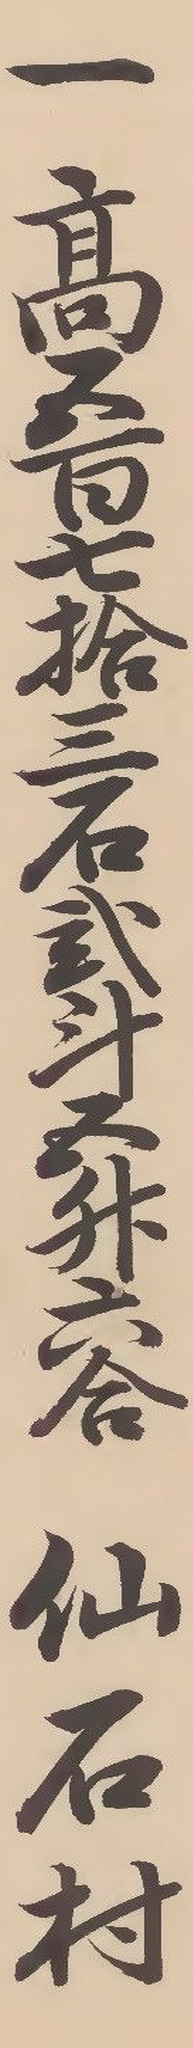一高五百七拾三石弐斗五升六合仙石村

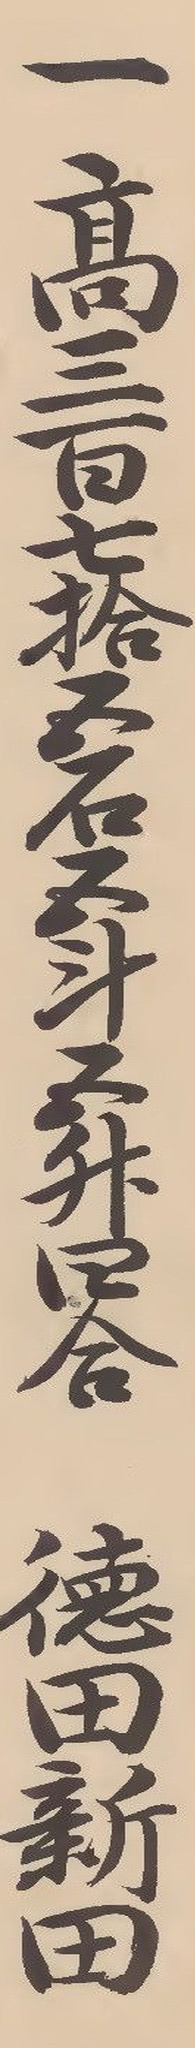一高三百七拾五石五斗五升四合徳田新田
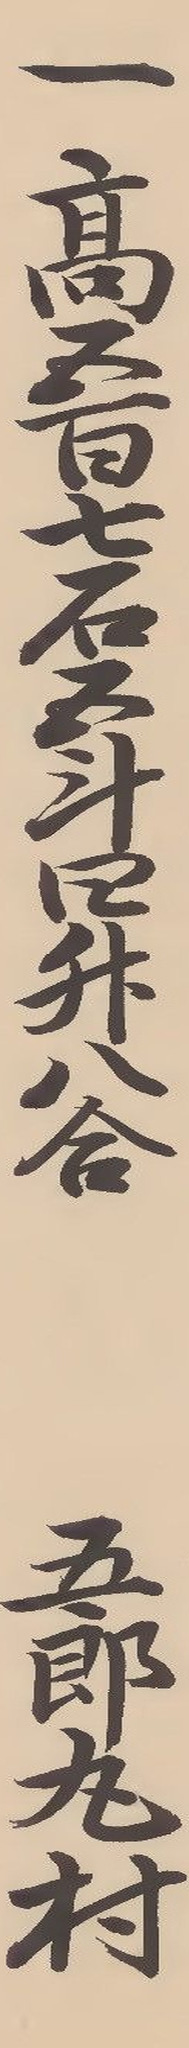一高五百七石五斗四升八合五郎丸村
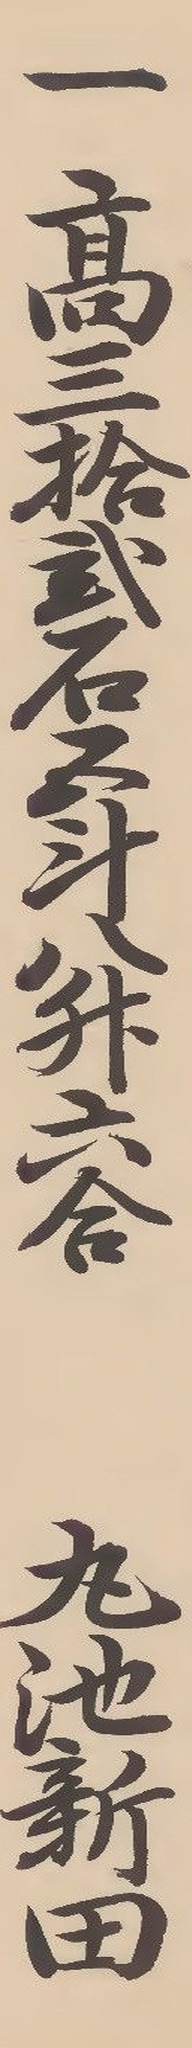一高三拾弐石五斗八升六合丸池新田
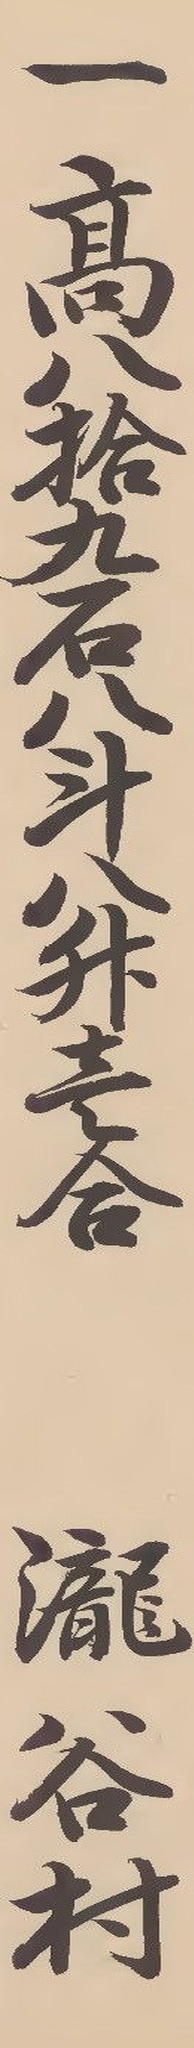一高八拾九石八斗八升壱合滝谷村
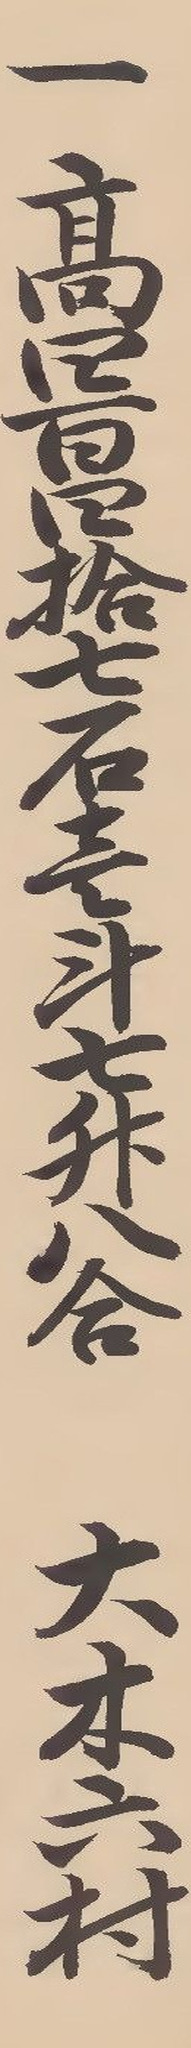一高四百四拾七石壱斗七升八合大木六村
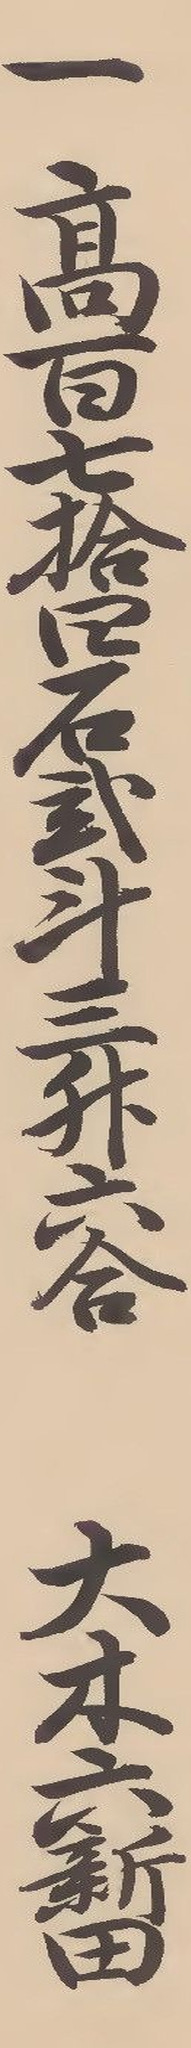一高百七拾四石弐斗三升六合大木六新田
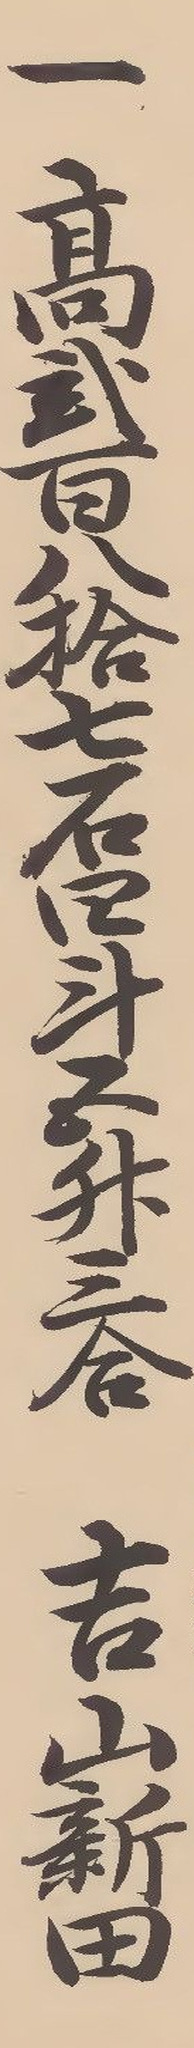一高弐百八拾七石四斗五升三合吉山新田
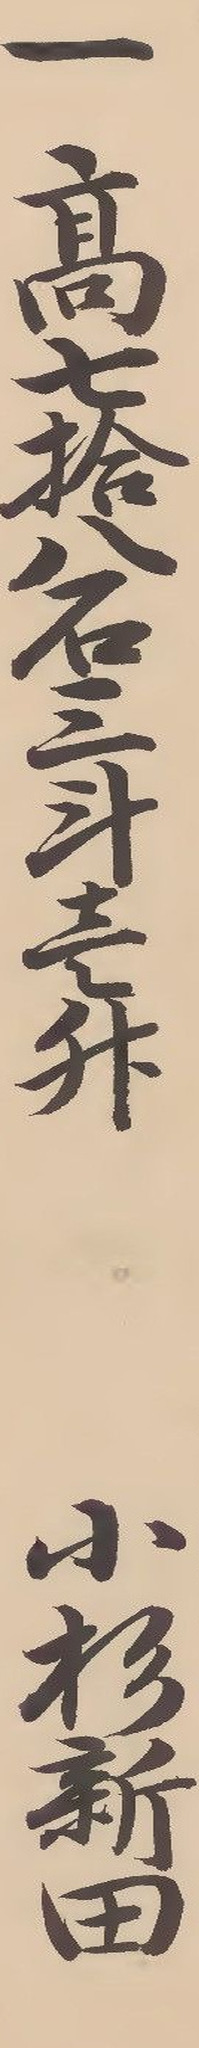一高七拾八石三斗壱升小杉新田

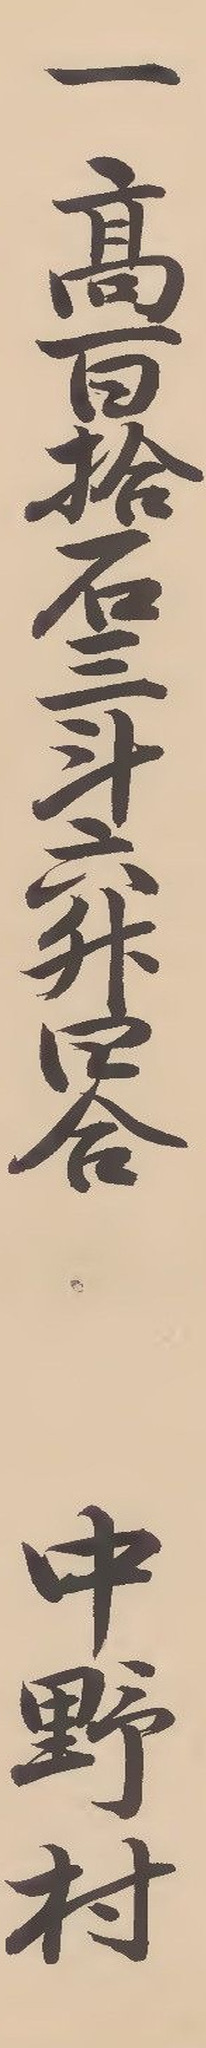一高百拾石三斗六升四合中野村
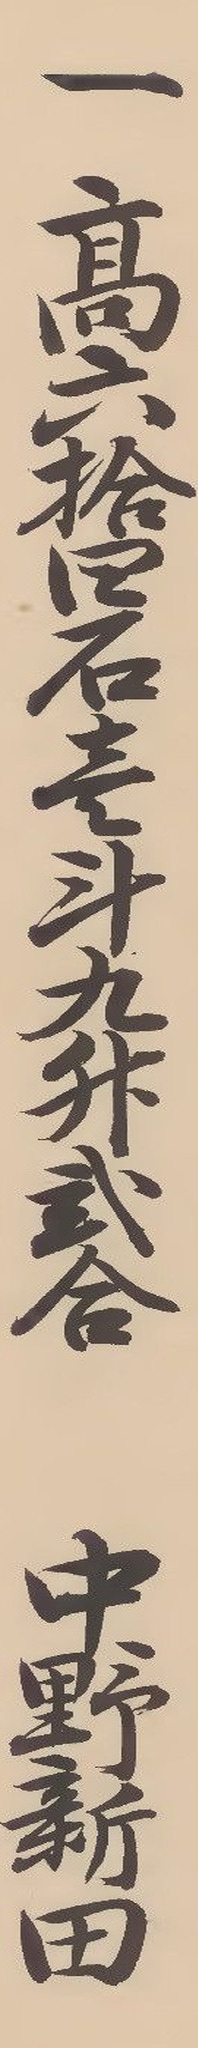一高六拾四石壱斗九升弐合中野新田
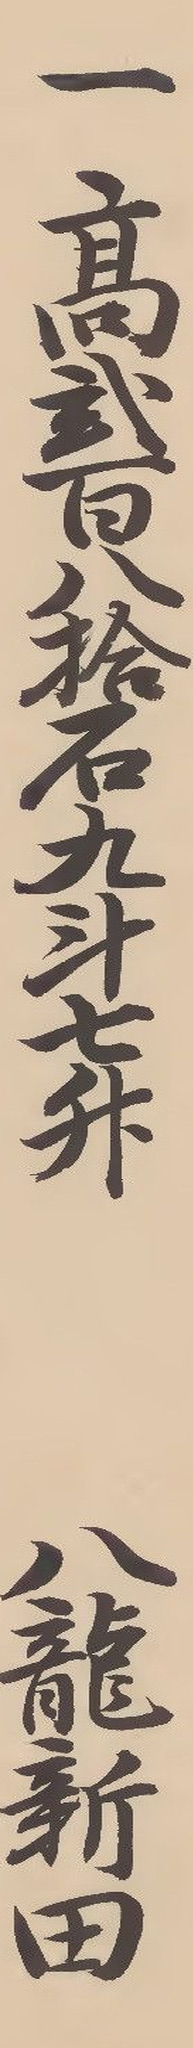一高弐百八拾石九斗七升八竜新田
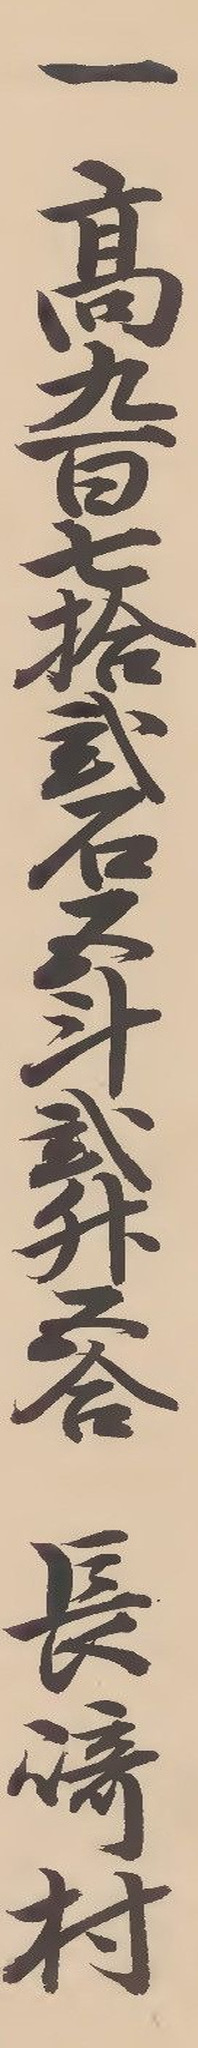一高九百七拾弐石五斗弐升五合長崎村
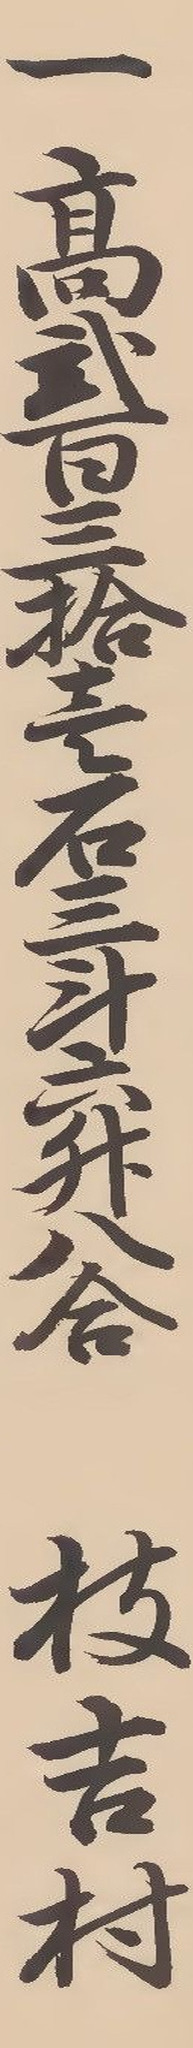一高弐百三拾壱石三斗六升八合枝吉村
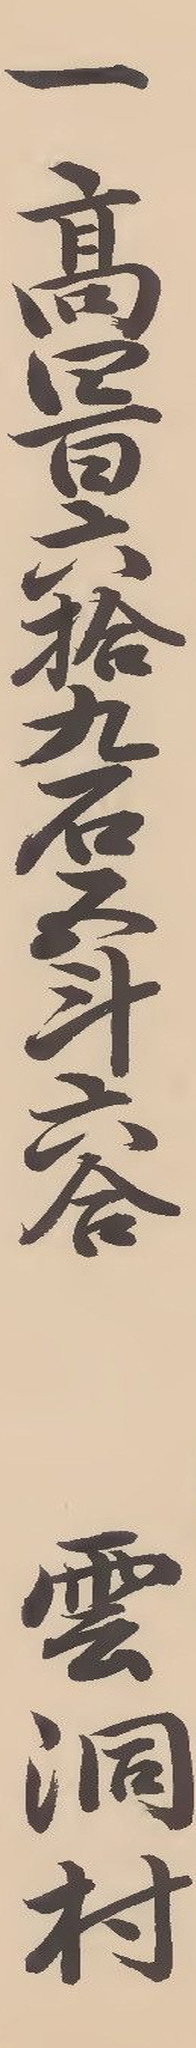一高四百六拾九石五斗六合雲洞村
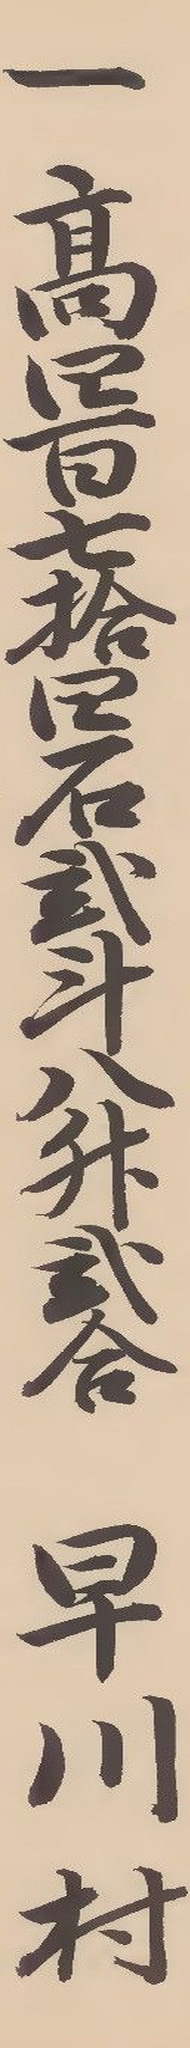一高四百七拾四石弐斗八升弐合早川村
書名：越後国郷帳　中
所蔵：国立公文書館 National Archives of Japan
